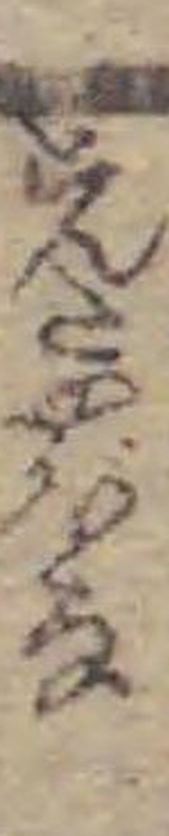とんたやぼな
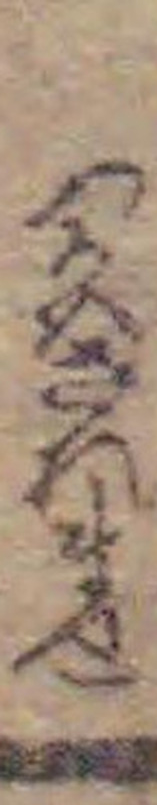つかはされませ
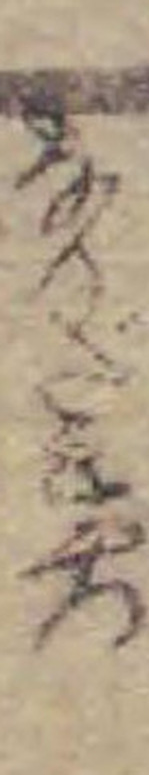なりだやつ
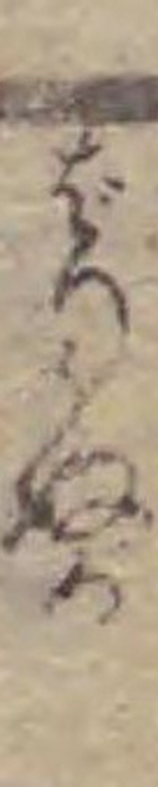ばりうぬが
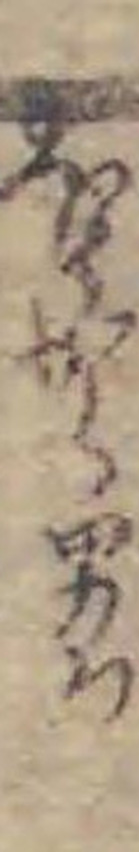ほうから男か
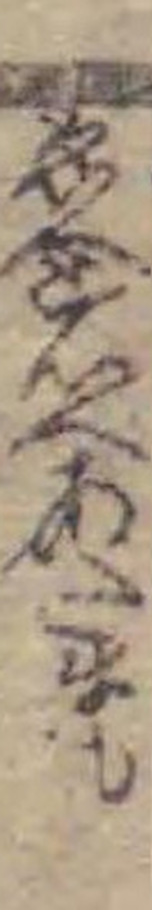ゑへと心へあたまも
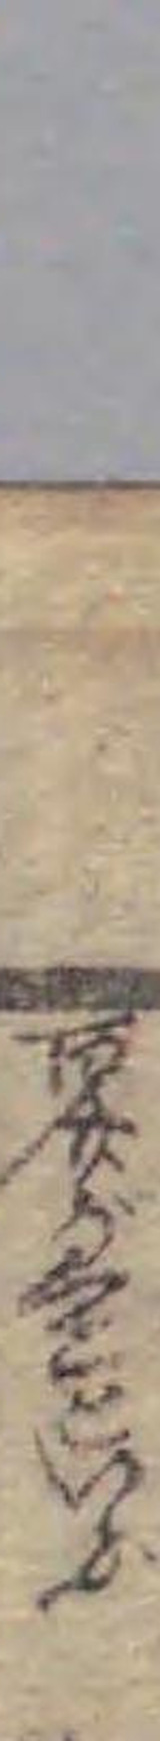百会がくれといふ
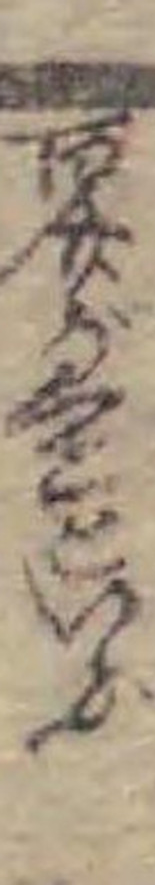百会がくれといふ
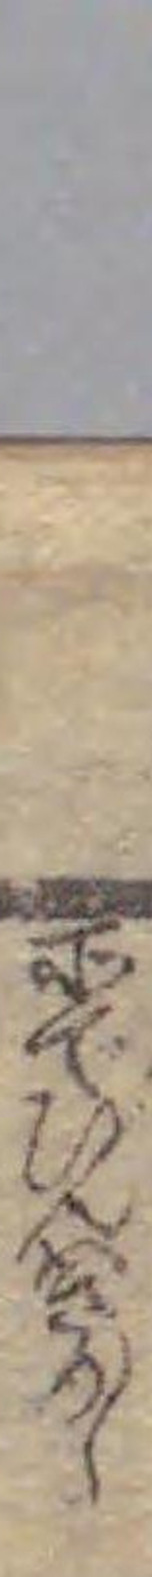所でびんはきり〳〵
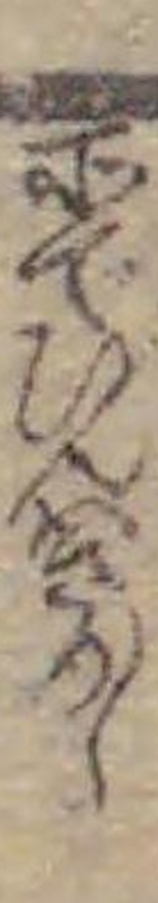所でびんはきり〳〵
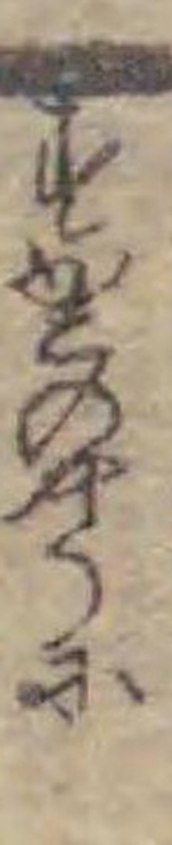すかみのやうに
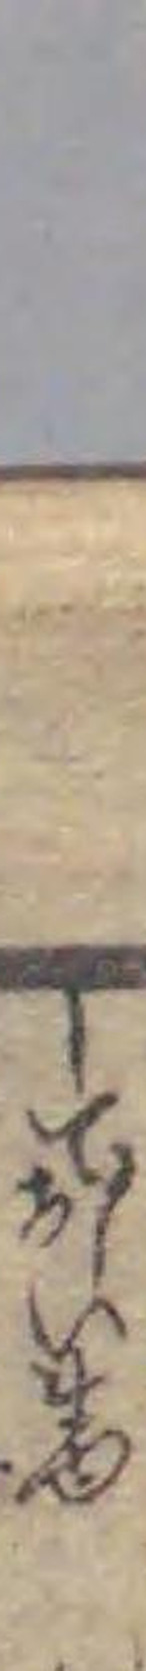しておしいまゆ
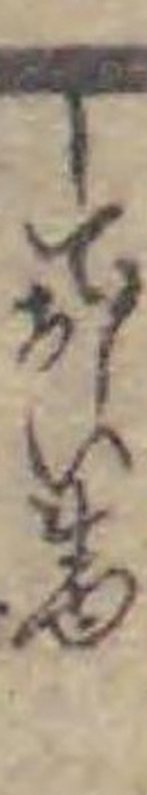しておしいまゆ
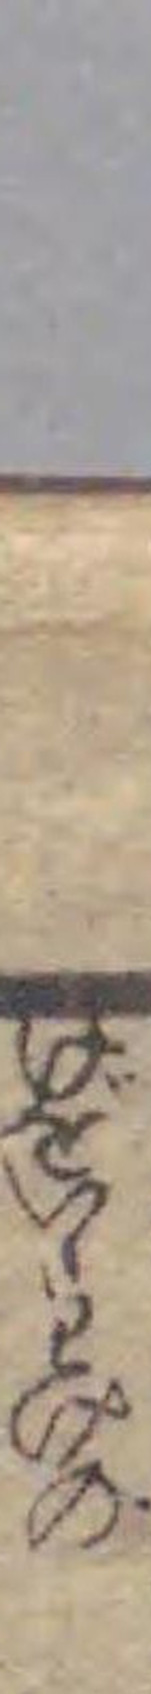げをいゝわけの
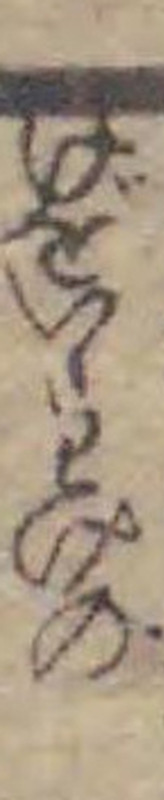げをいゝわけの
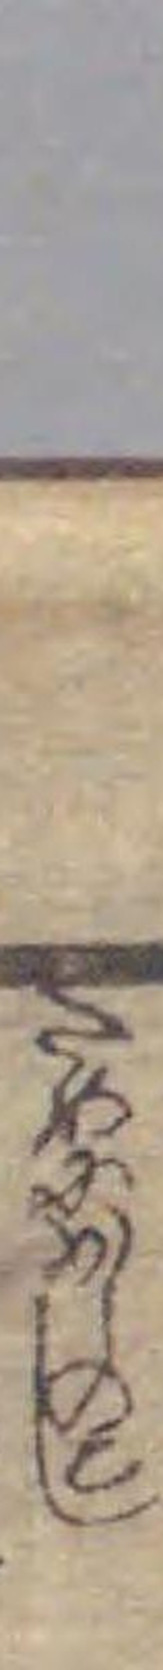ために少しのこし
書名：通風伊勢物語 : 3巻
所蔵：国立国会図書館 National Diet Library, JAPAN
